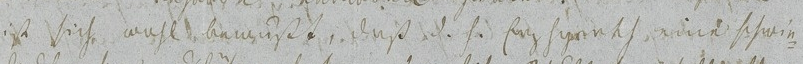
ist sich wohl bewußt, daß d.h. Erziehungsrth eine schwie-
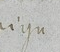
rige
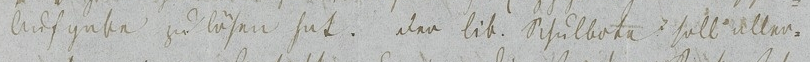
Aufgabe zu lösen hat. Der lib. Schulbote soll aller-
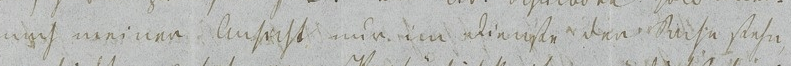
nach meiner Ansicht nur im Dienste der Sache stehn,
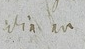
die er
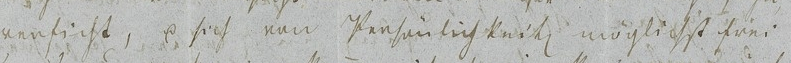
verficht, & sich von Persönlichkeiten möglichst frei
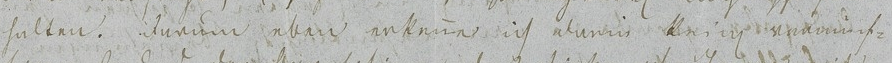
halten. Darum eben erkenne ich nun keinen vernünf-
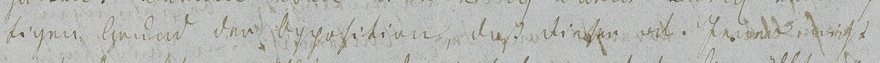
tigen Grund der Opposition, daß Dieser od. Jener nicht
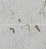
in
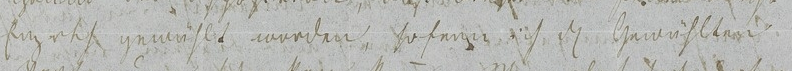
den Erzrth gewählt worden, so fern ich dem Gewählten
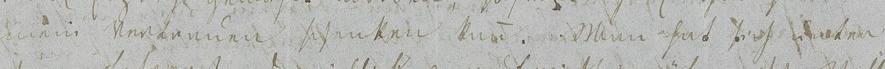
mein Vertrauen schenken kann. Man hat sich unter
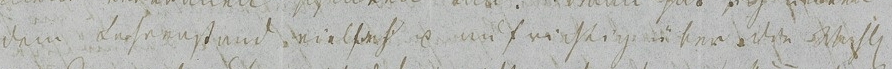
dem Lehrerstand vielfach & aufrichtig über die Wahlen
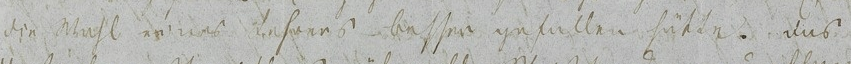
die Wahl eines Lehrers besser gefallen hätte. Das
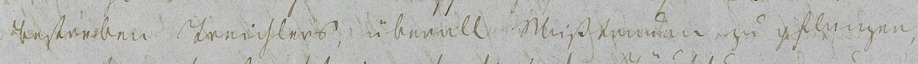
Bestreben Treichlers, überall Mißtrauen zu pflanzen,
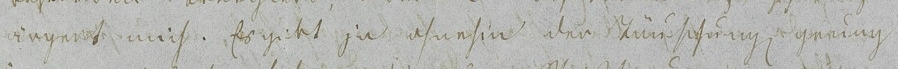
ärgert mich. Es gibt ja ohnehin der Täuschungen genug
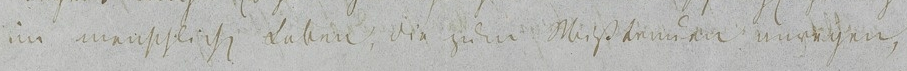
im menschlichen Leben, die zum Mißtrauen anregen;
